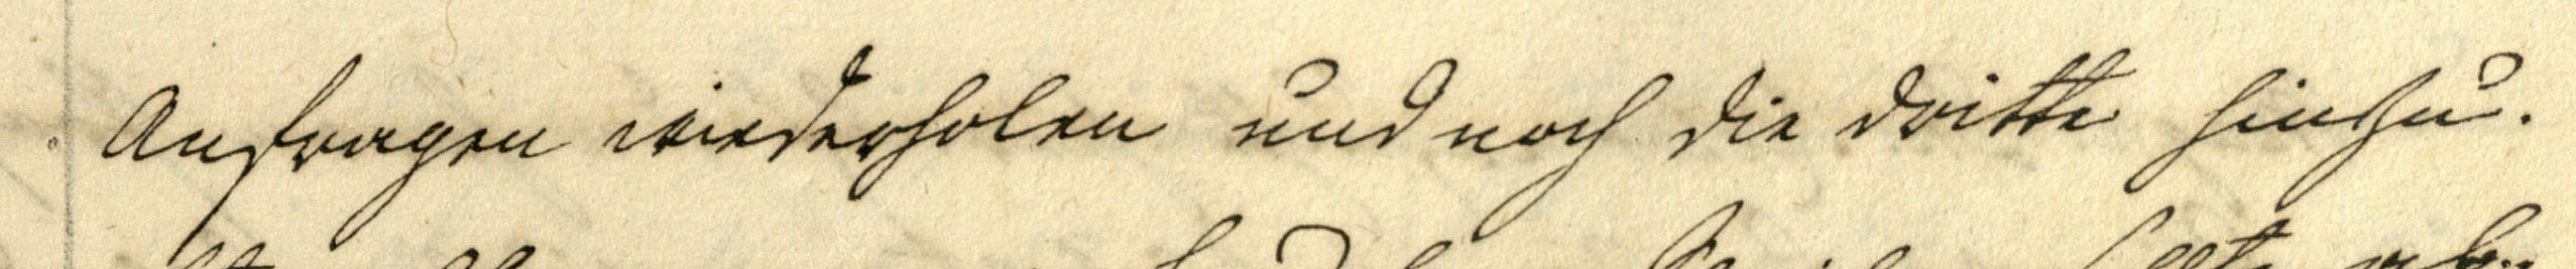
Anfragen wiederholen und noch die dritte hinzu
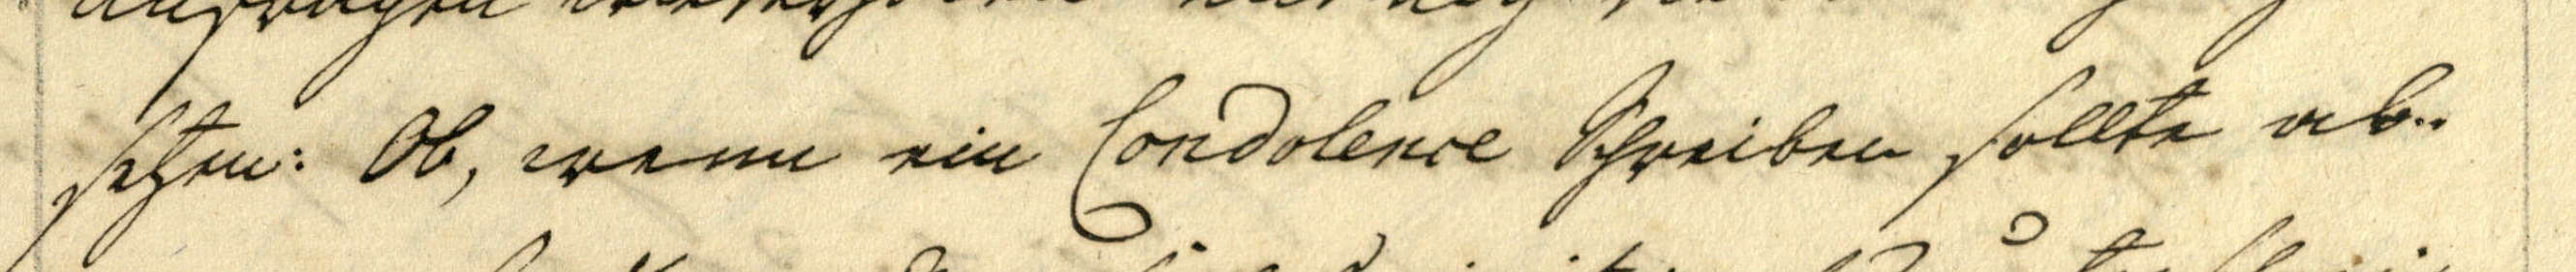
setzen: Ob, wenn ein Condolence Schreiben sollte ab-
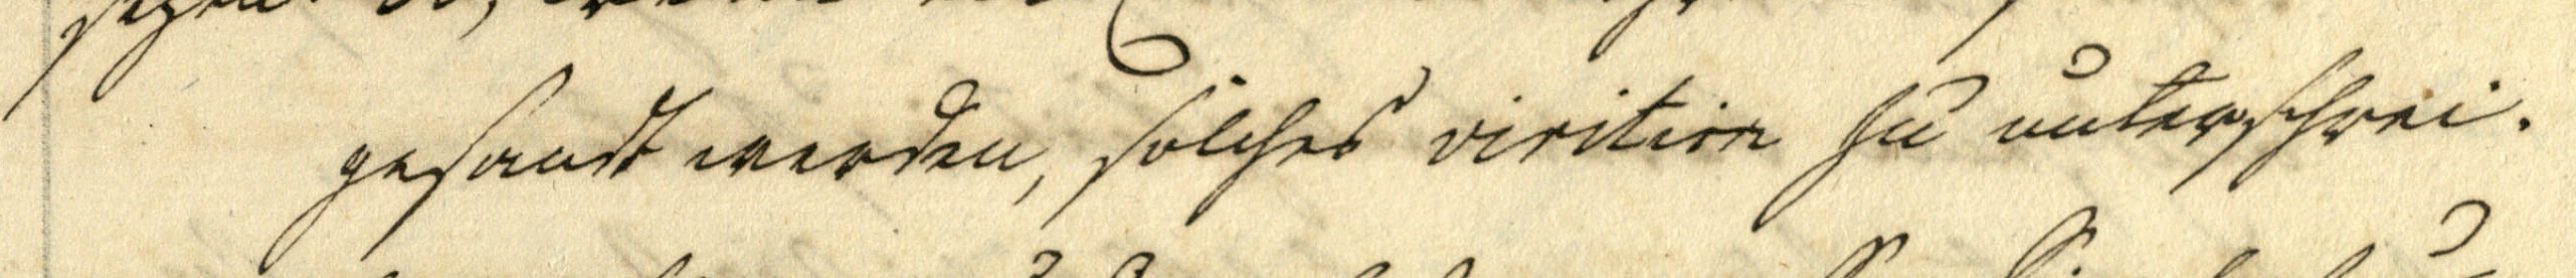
gesandt werden, solches viritim zu unterschrei-
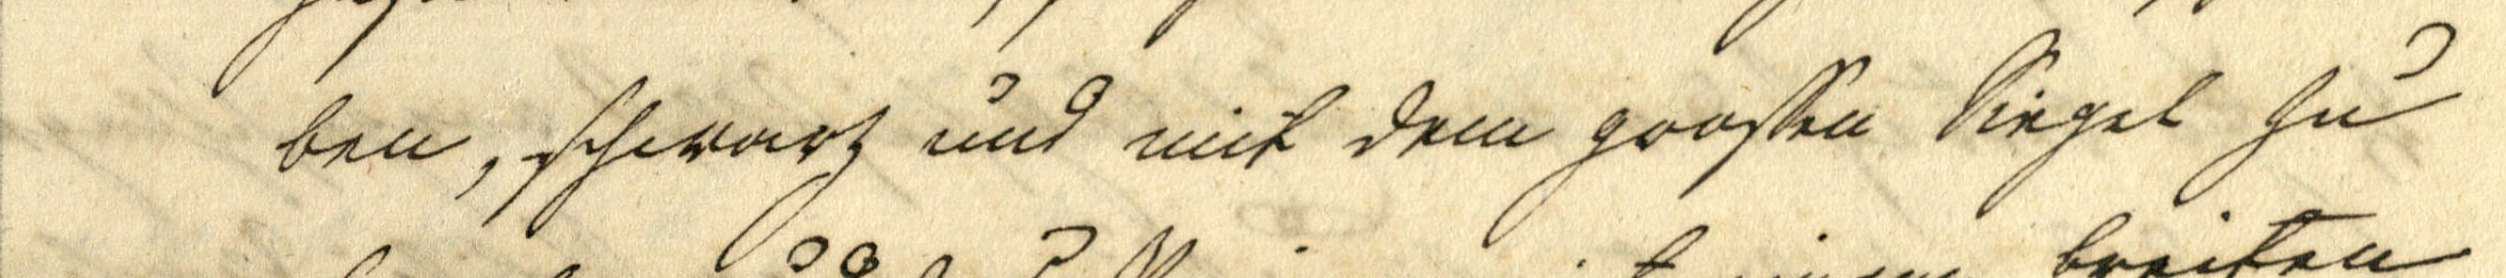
ben, schwarz und mit dem grossen Siegel zu
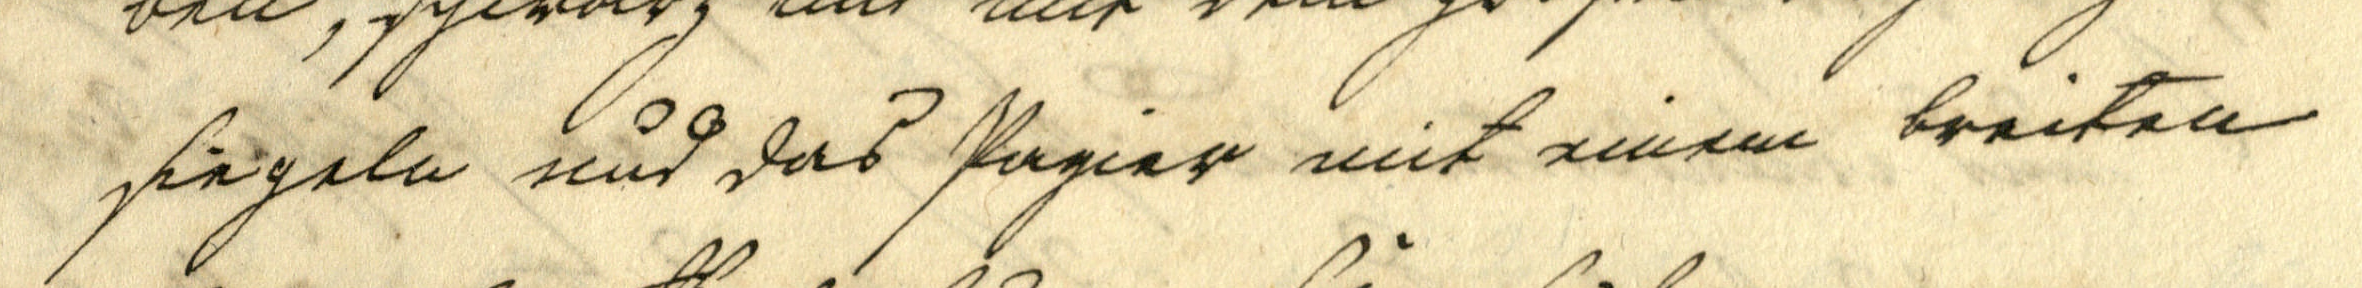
siegeln und das Papier mit einem breiten
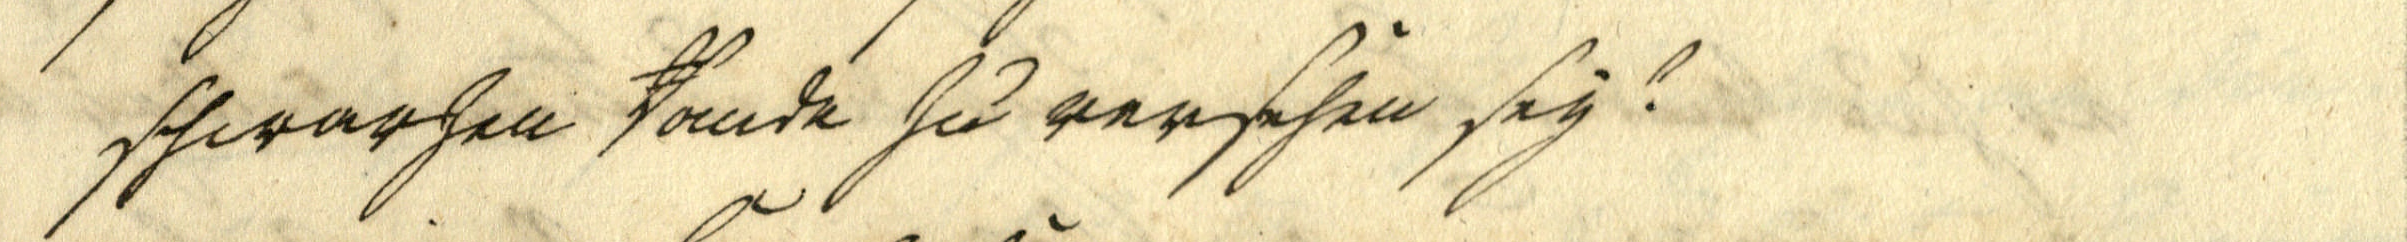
schwarzen Rande zu versehen sey?
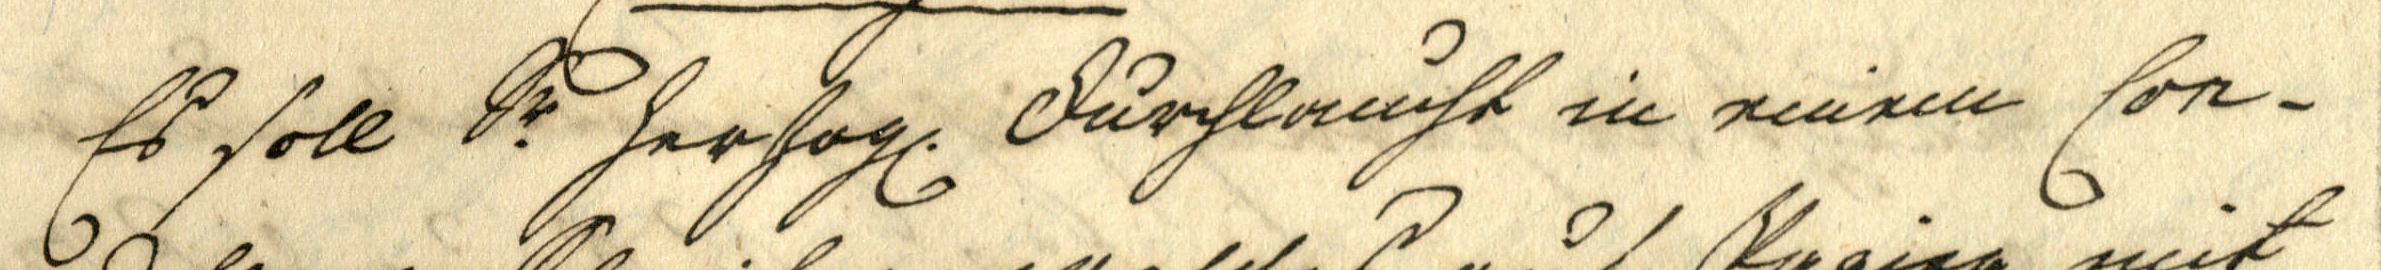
Es soll Sr. herzogl. Durchlaucht in einem Con-
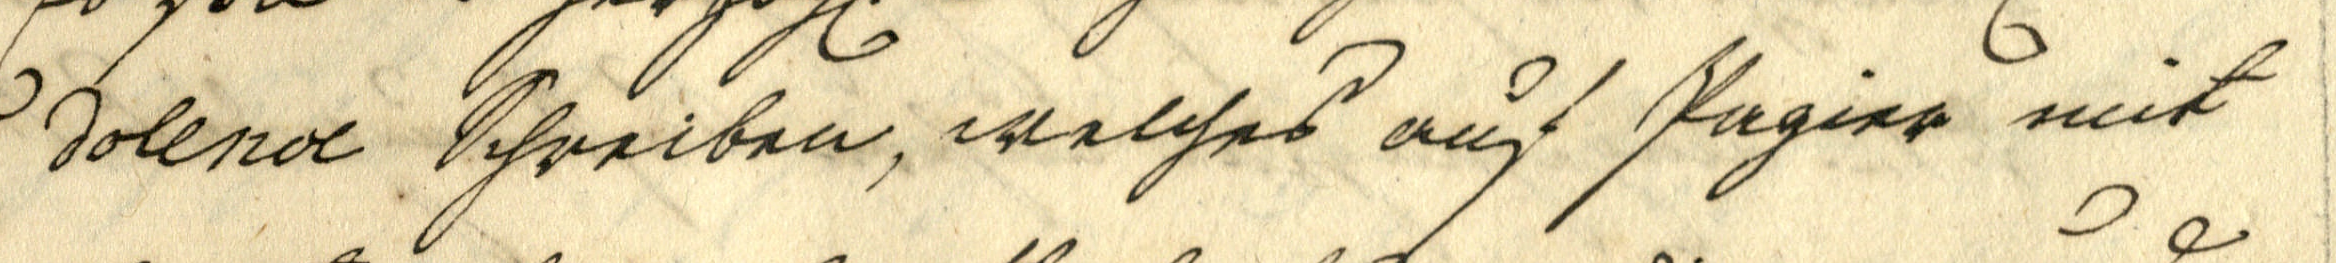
dolence Schreiben, welches auf Papier mit
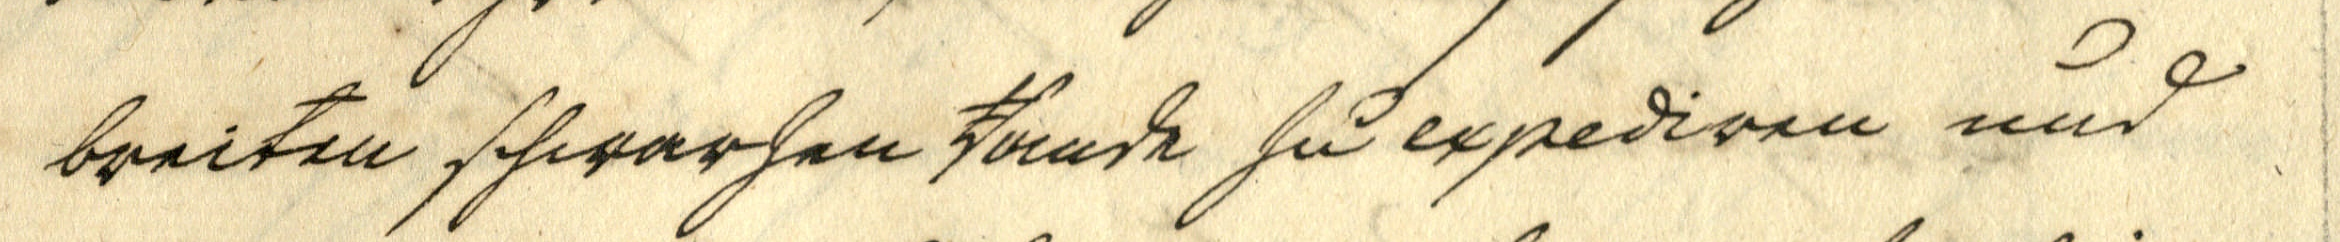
breiten schwarzen Rande zu expedieren und
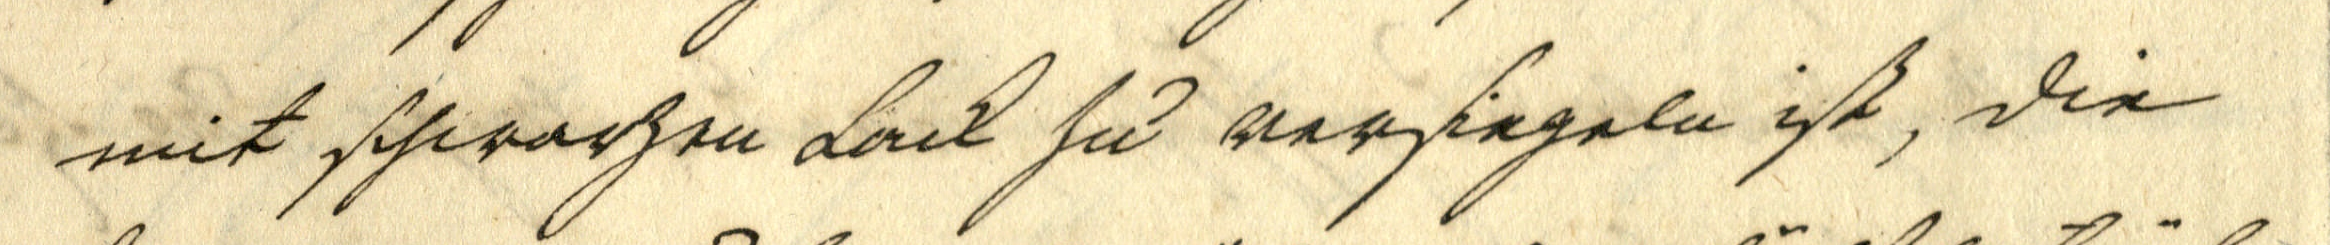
mit schwarzen Lack zu versiegeln ist, die
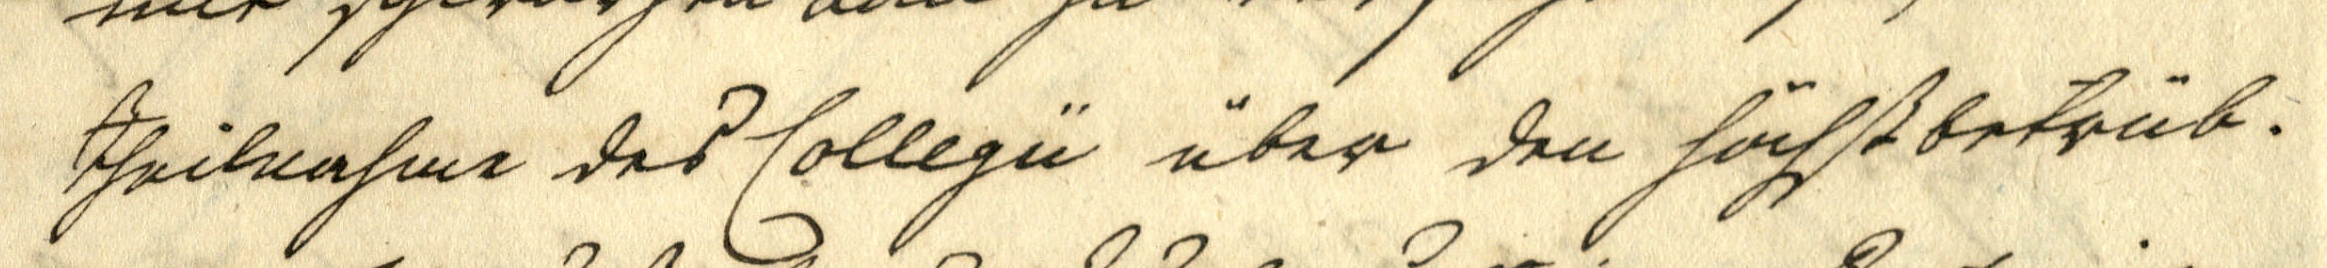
Theilnahme des Collegii über den höchstbetrüb-
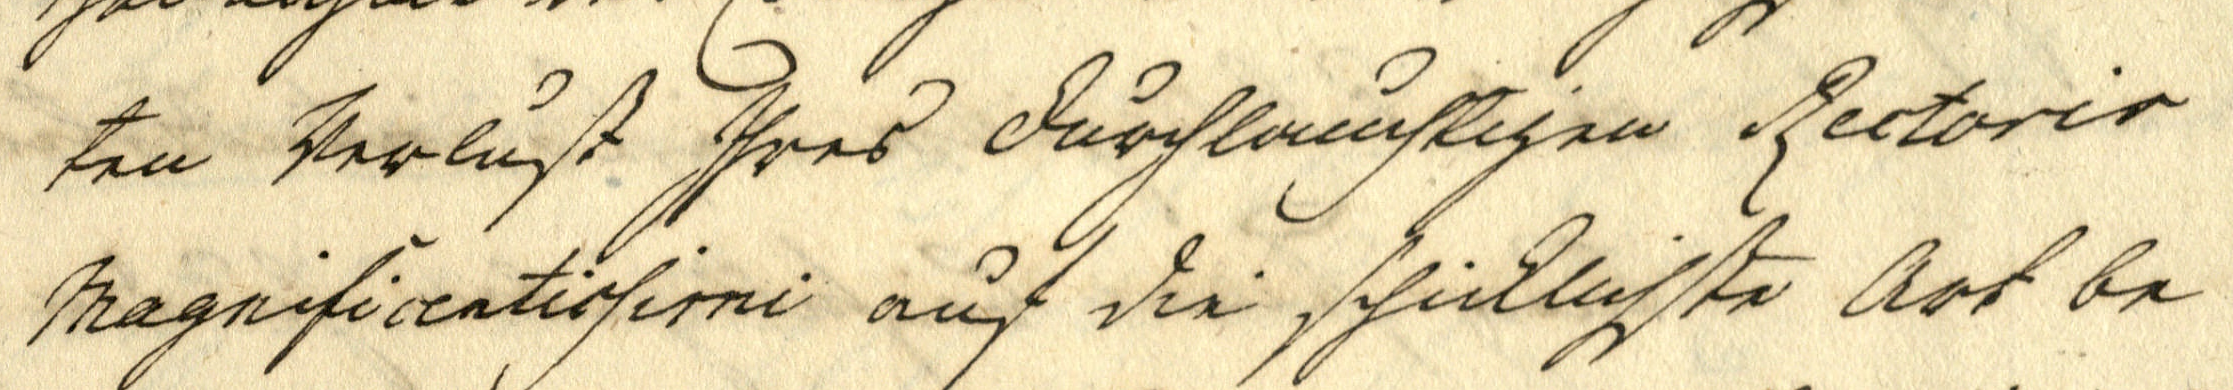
ten Verlust Ihres durchlauchtigen Rectoris
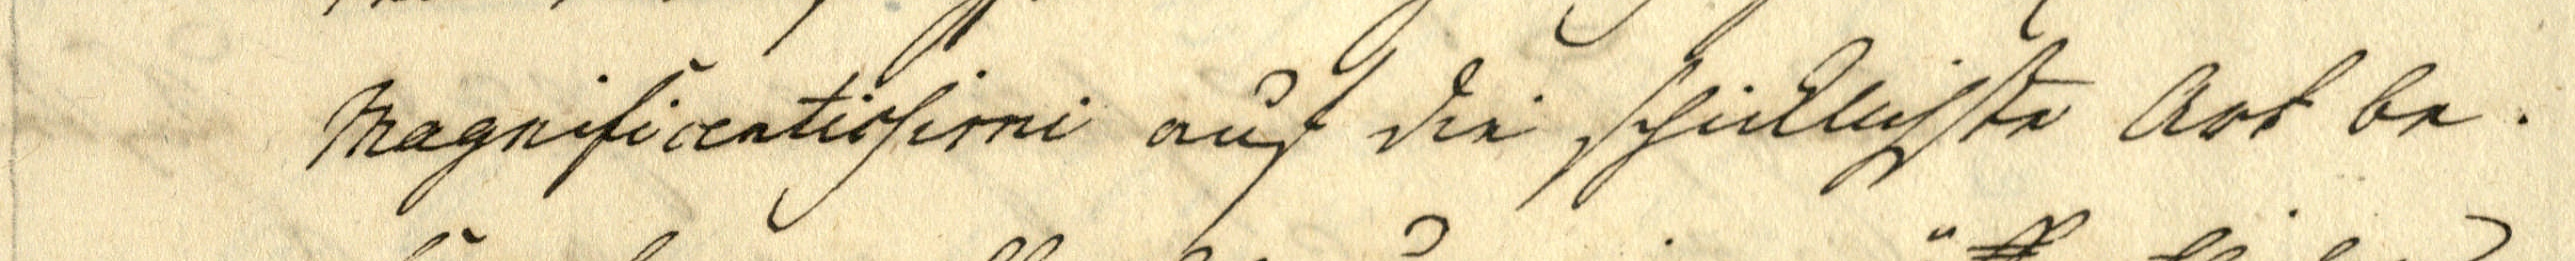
Magnificentissimi auf die schicklichste Art be-
